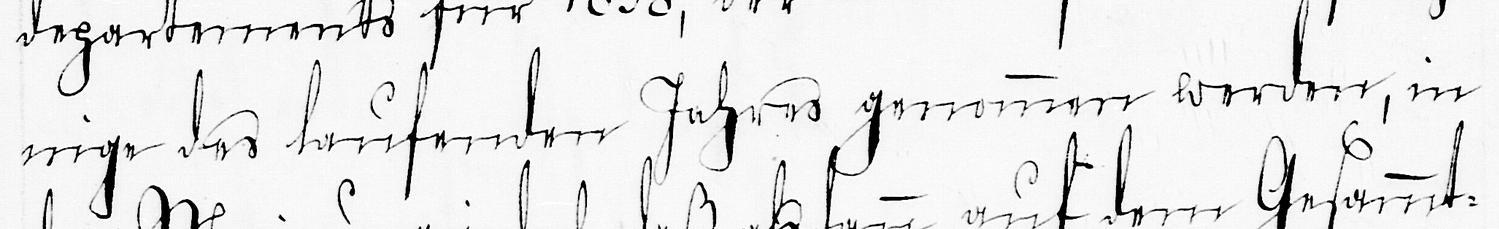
nige des laufenden Jahres genommen werden, in
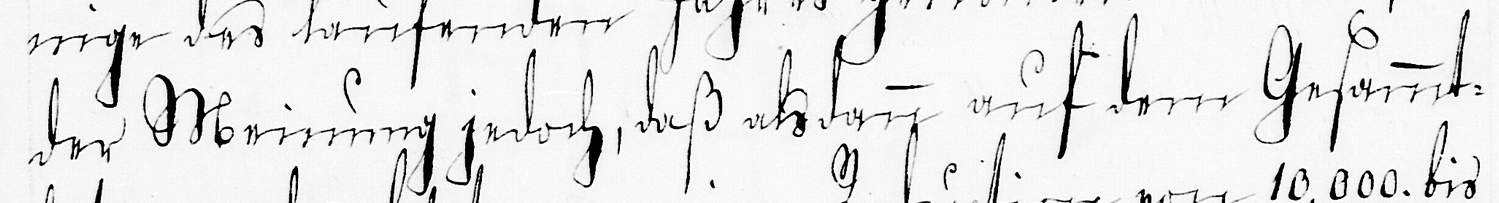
der Meinung jedoch, daß alsdann auf dem Gesammt¬
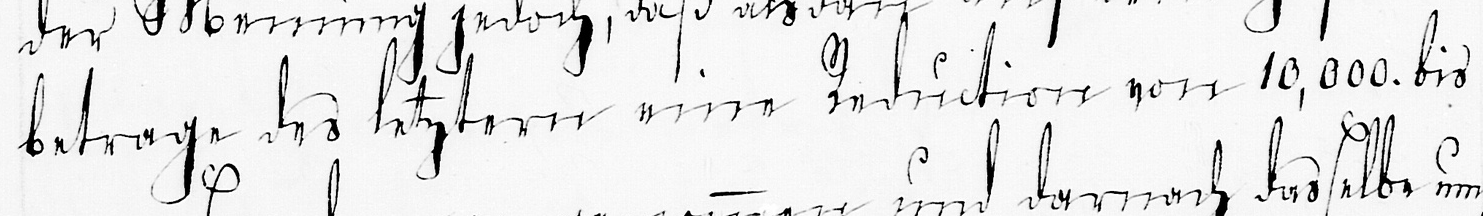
betrage des letztern eine Reduction von 10,000. bis
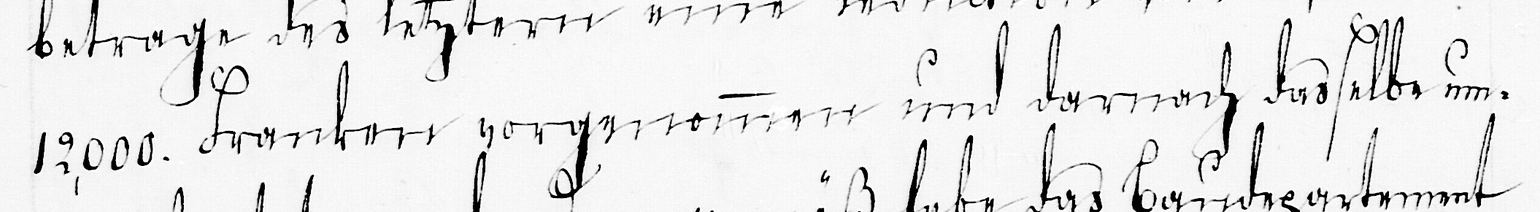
12,000. Franken vorgenommen und darnach dasselbe um¬
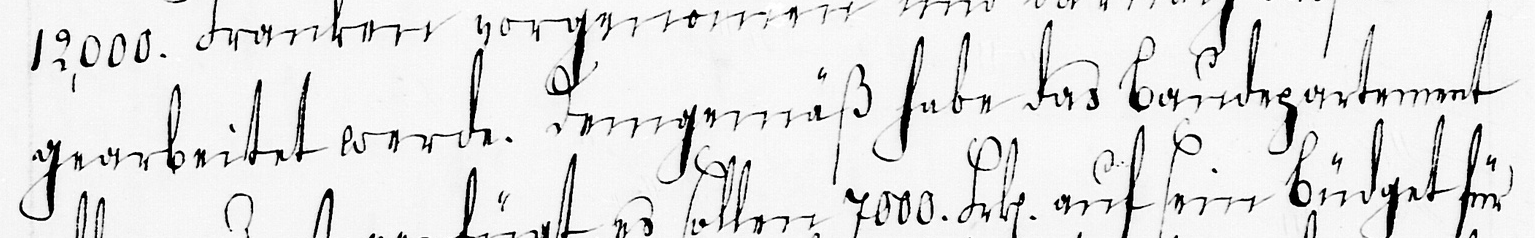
gearbeitet werde. Demgemäß habe das Baudepartement
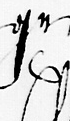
4.)
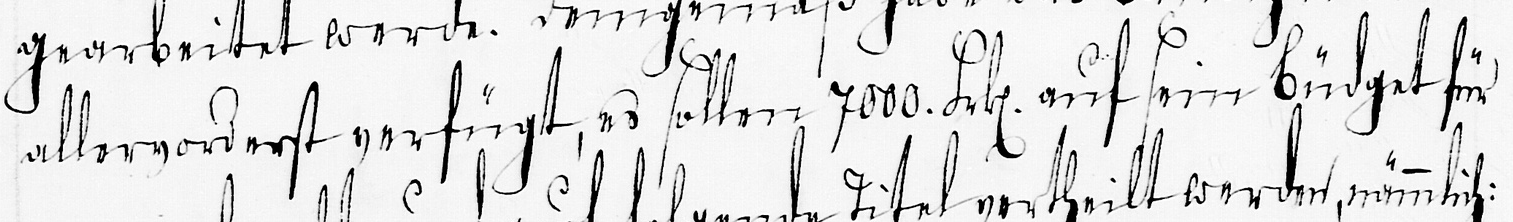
allervorderst verfügt, es sollen 7000. Frk[en]. auf sein
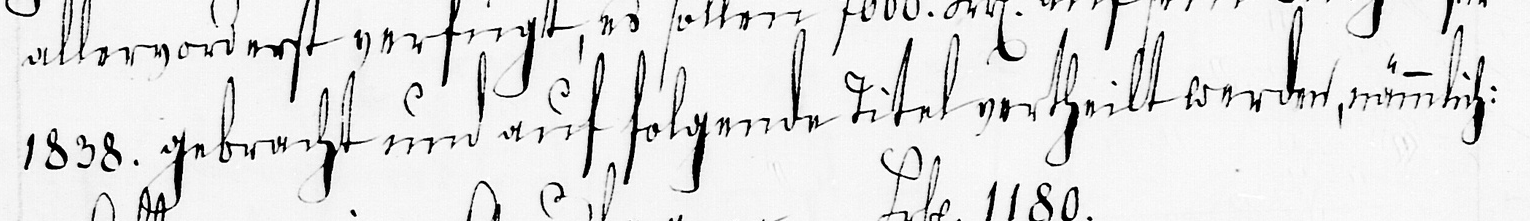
1838. gebracht und auf folgende Titel ertheilt werden, nämml¬
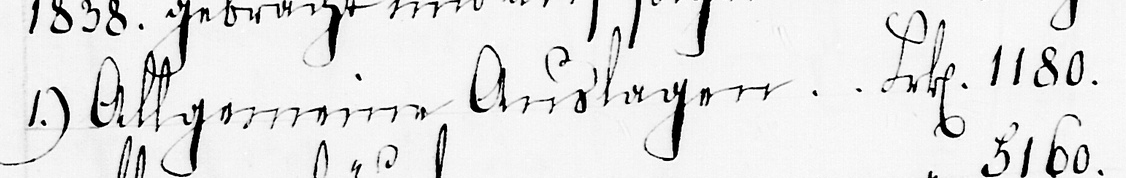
1.) Allgemeine Auslagen Frk[en]. 1180.
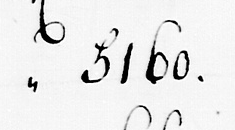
23 400.
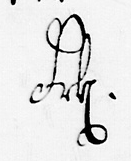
die
